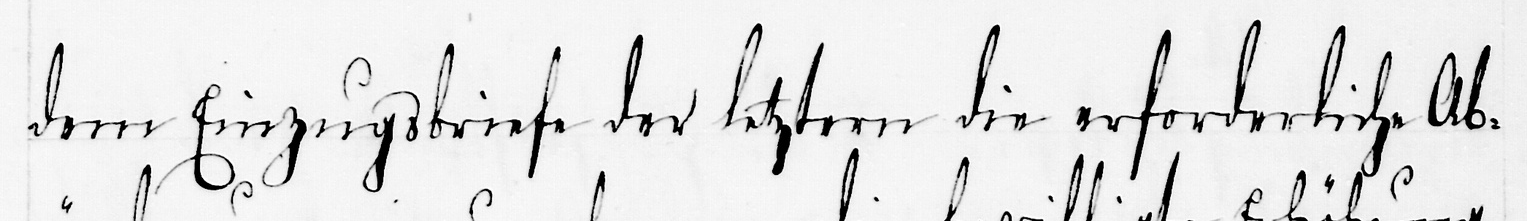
dem Einzugsbriefe der letztern die erforderliche Ab¬
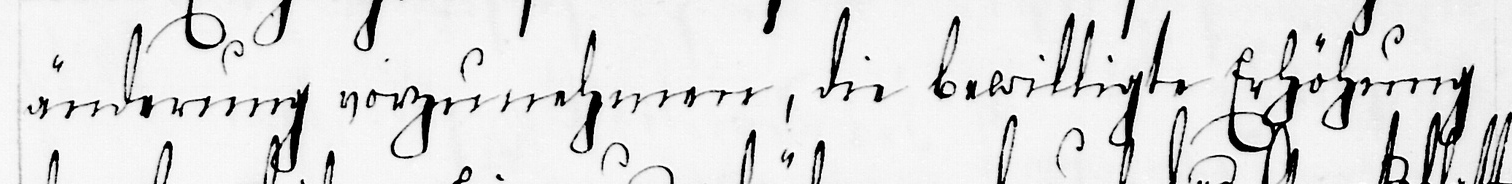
änderung vorzunehmen, die bewilligte Erhöhung
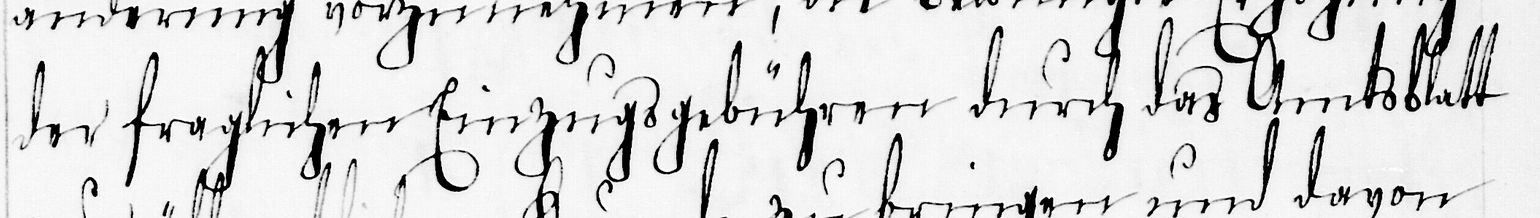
der fraglichen Einzugsgebühren durch das Amtsblatt
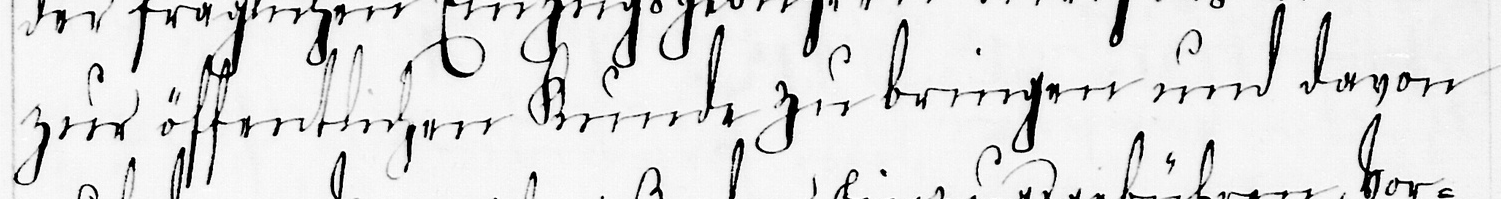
zur öffentlichen Kunde zu bringen und davon
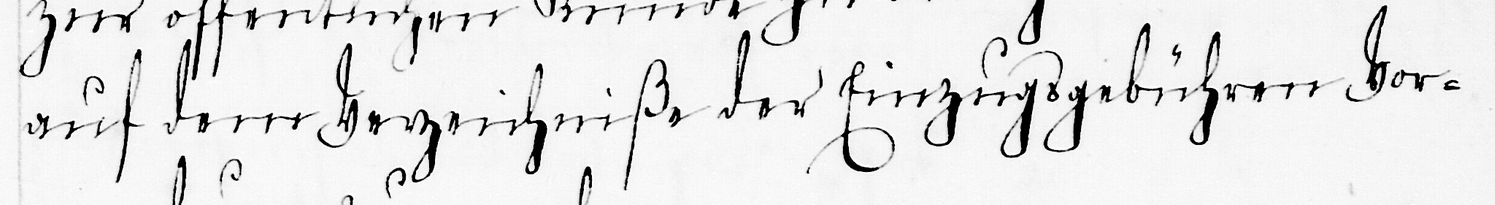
auf dem Verzeichniße der Einzugsgebühren Vor¬
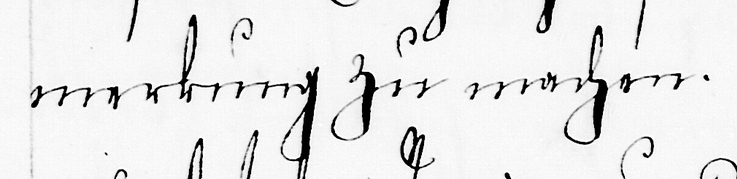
merkung zu machen.
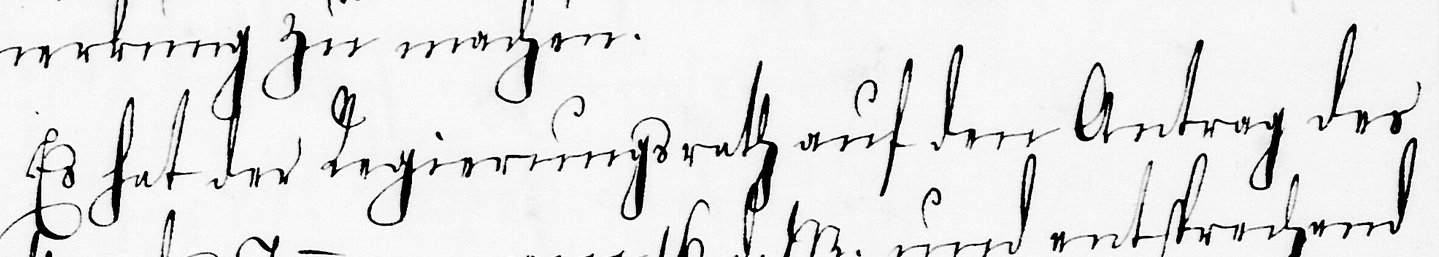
Es hat der Regierungsrath auf den Antrag des
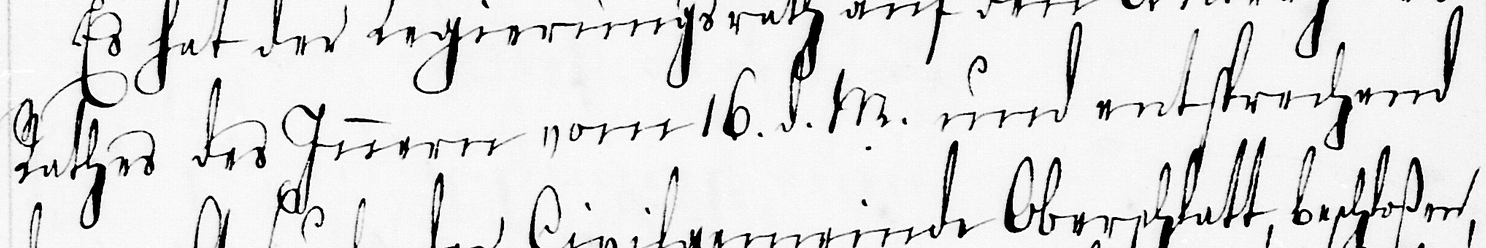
Rathes des Innern vom 16. d. M. und entsprechend
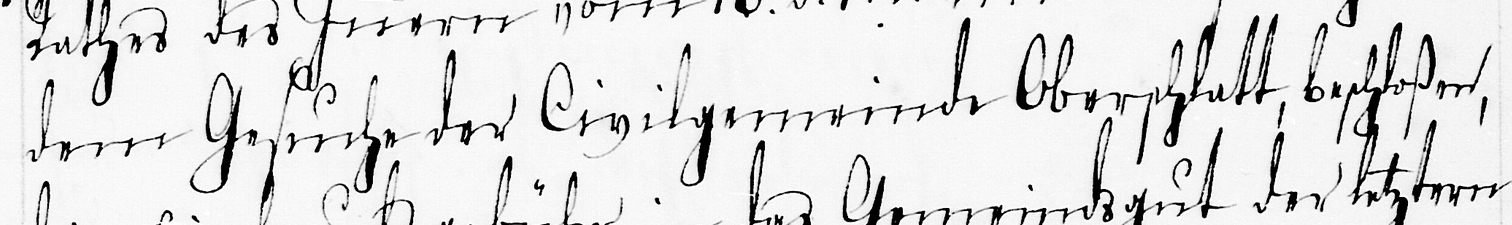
dem Gesuche der Civilgemeinde Oberschlatt, beschlo¬
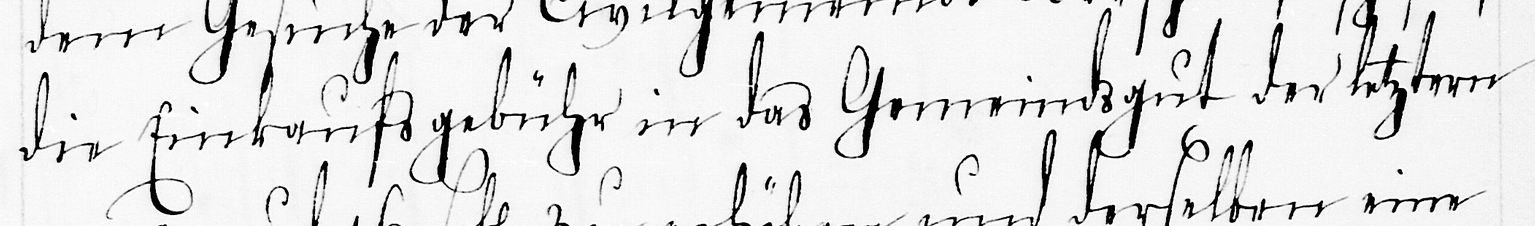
die Einkaufsgebühr in das Gemeindsgut der letztern
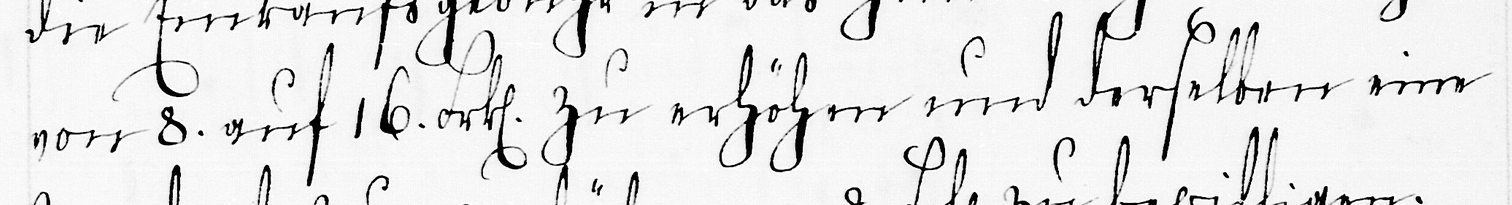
von 8. auf 16. Frk[en]. zu erhöhen und derselben eine
